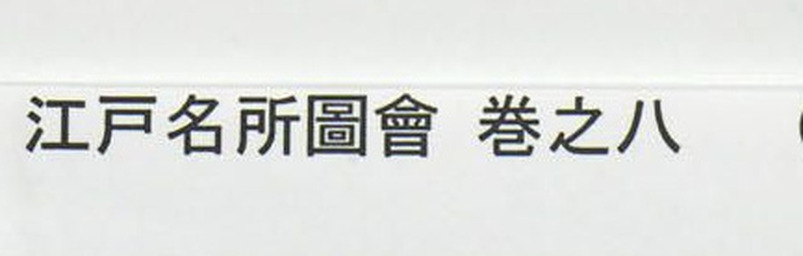江戸名所図會八

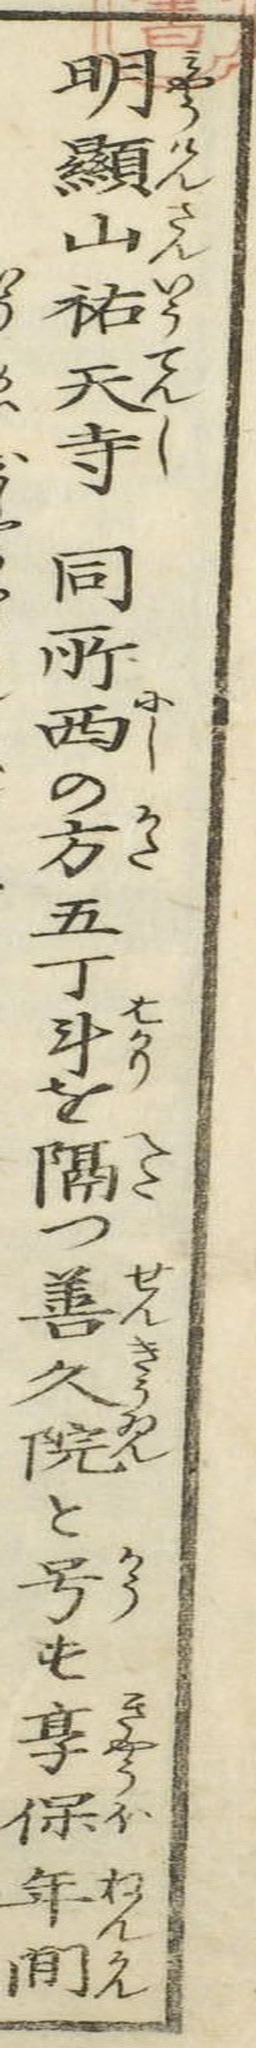明顯山祐天寺同所西の方五丁斗を隔つ善久院と号す享保年間
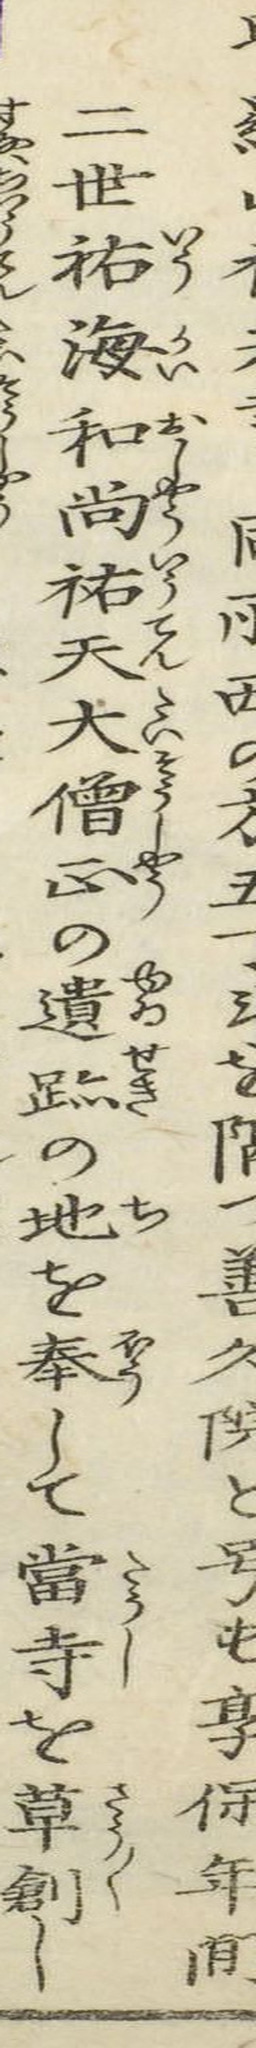二世祐海和尚祐天大僧正の遺跡の地を奉して當寺を草創し
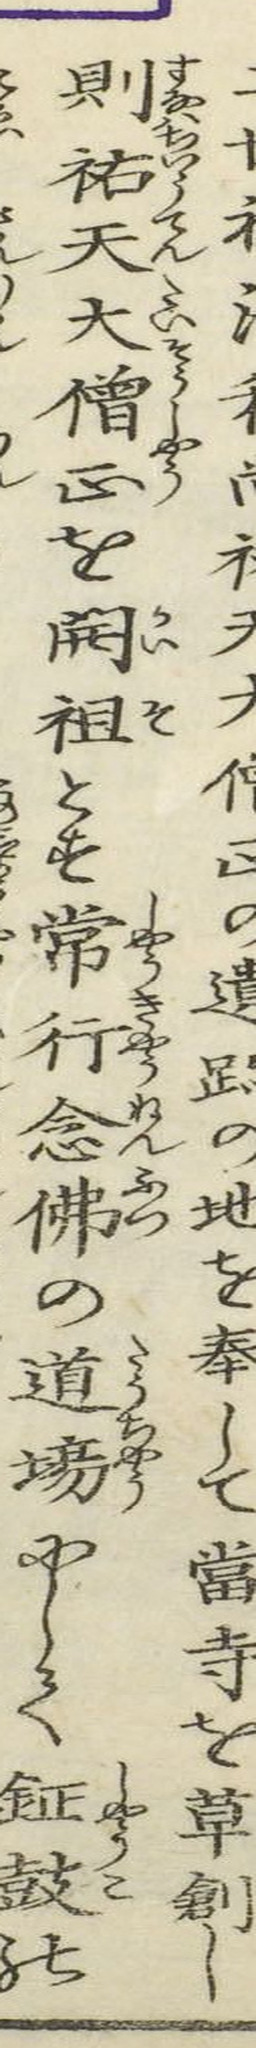則祐天大僧正を開祖とす常行念佛の道塲にして鉦鼓の
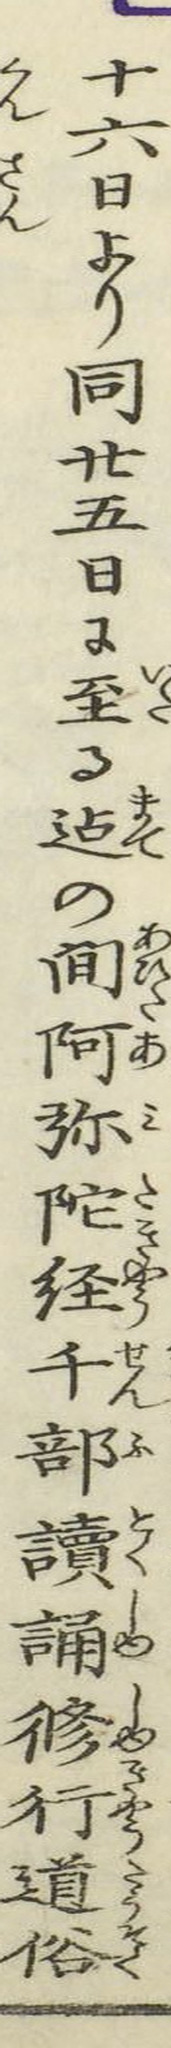十六日より同廿五日に至る迠の間阿弥陀経千部読誦修行道俗
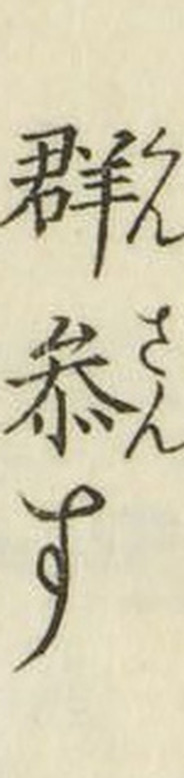群参す

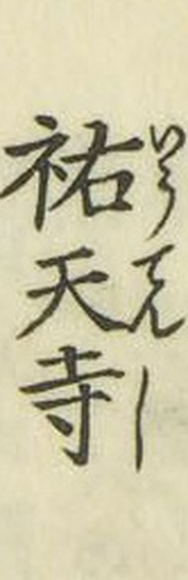祐天寺

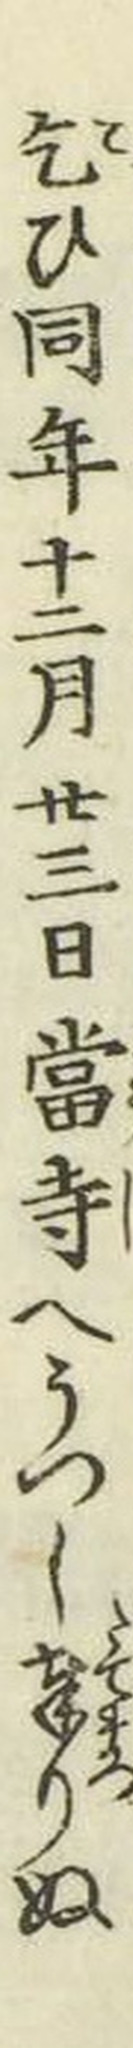乞ひ同年十二月廿三日當寺へうつし奉りぬ
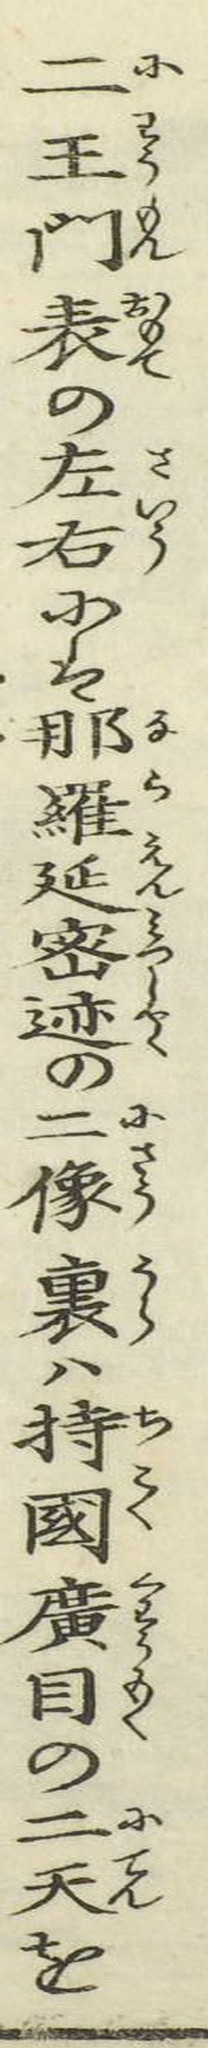二王門表の左右には那羅延密迹の二像裏は持國廣目の二天を
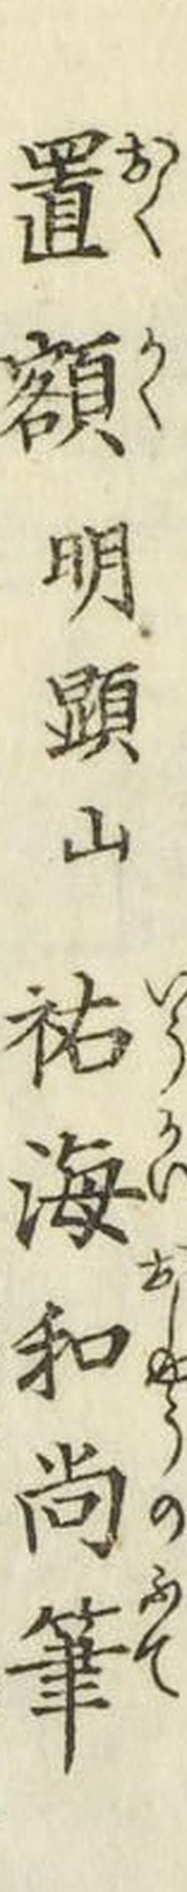置額明顕山祐海和尚筆

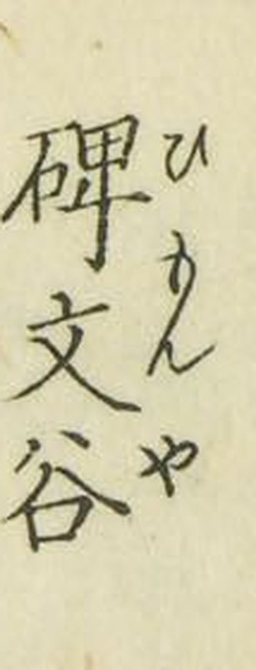碑文谷
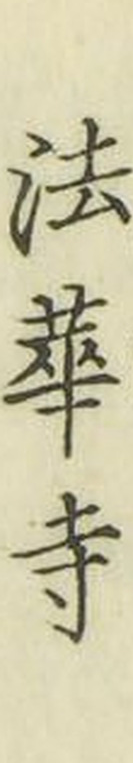法華寺

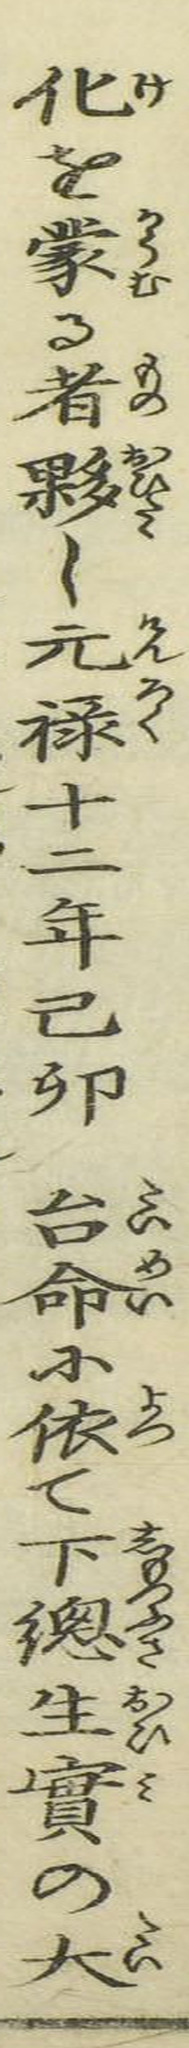化を蒙る者夥し元禄十二年己卯台命に依て下總生實の大
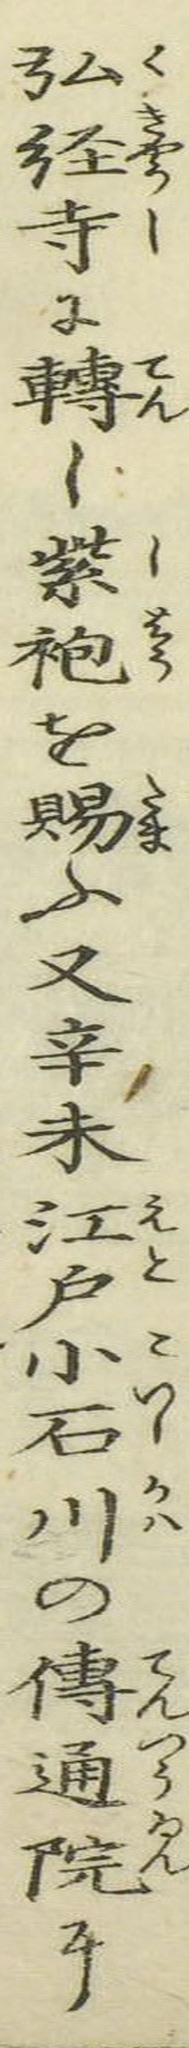弘経寺に轉し紫袍を賜ふ又辛未江戸小石川の傳通院に
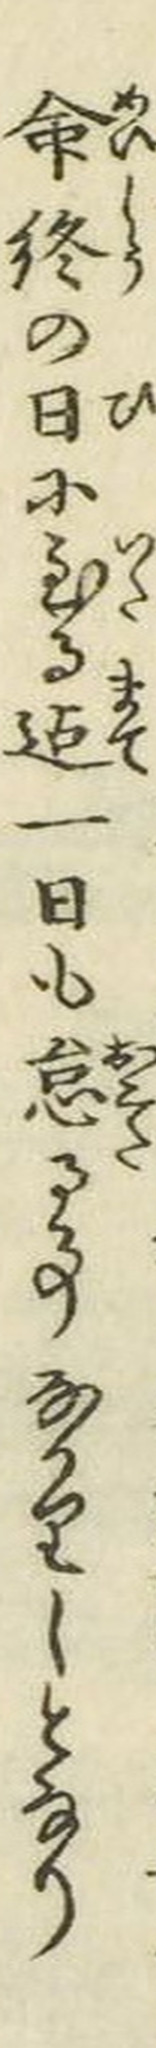命終の日に至る迠一日も怠る事なかりしとなり
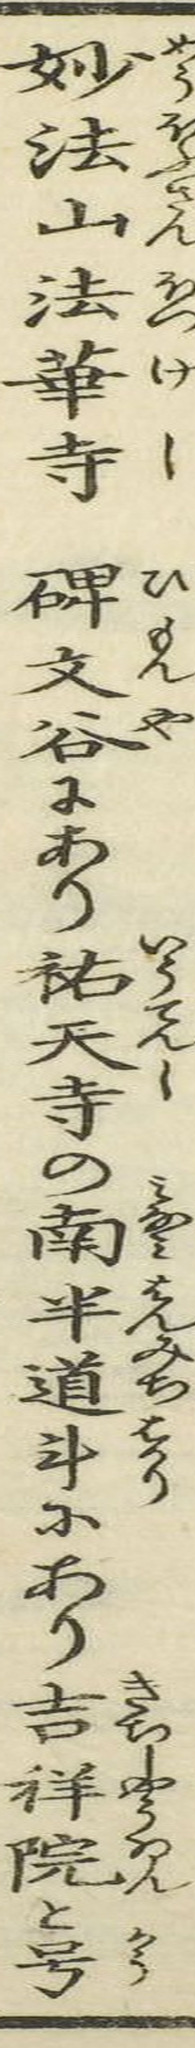妙法山法華寺碑文谷にあり祐天寺の南半道斗にあり吉祥院と号
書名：江戸名所図会 20巻 巻之8
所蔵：東京学芸大学教育コンテンツアーカイブ
